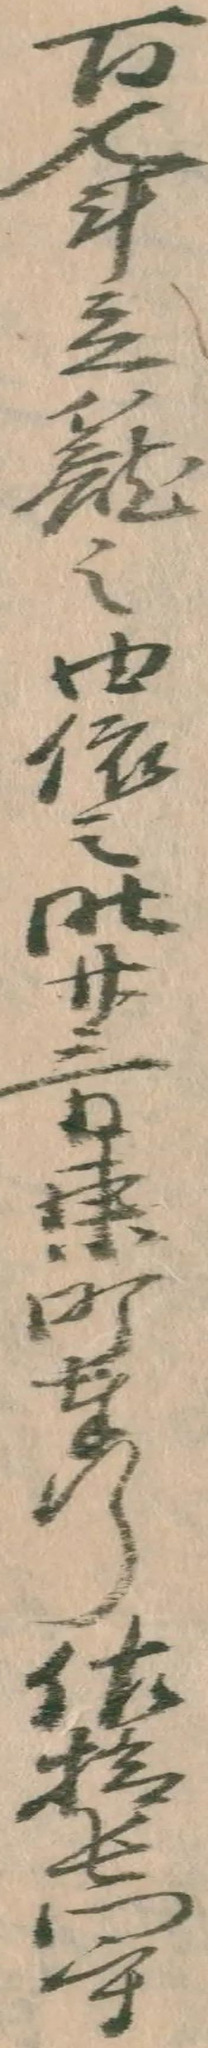百人斗立籠之由依之昨廿三日東町奉行佐橋長門守
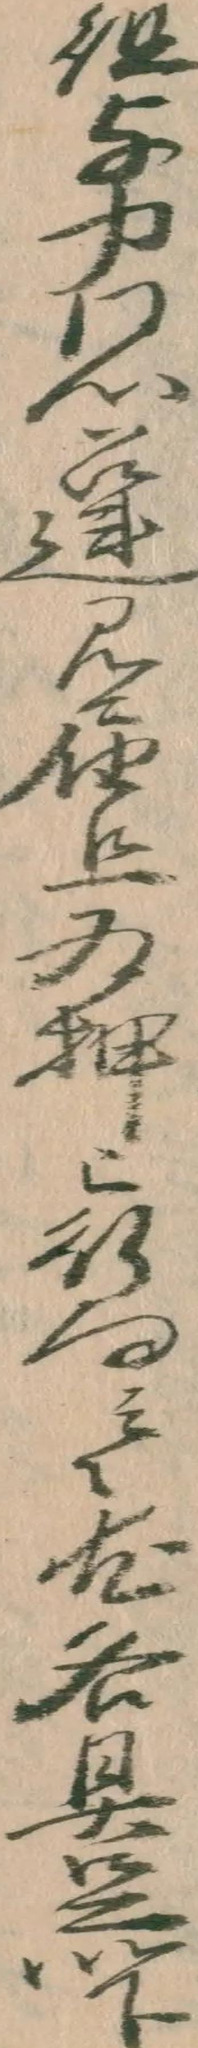組与力同心召連見届且為押被行向云々尤各具足以下
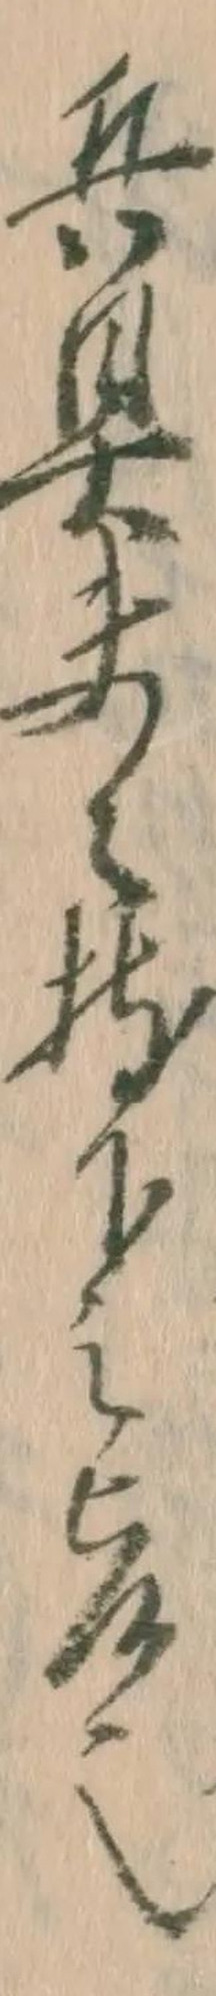兵具夫〻持下之旨也
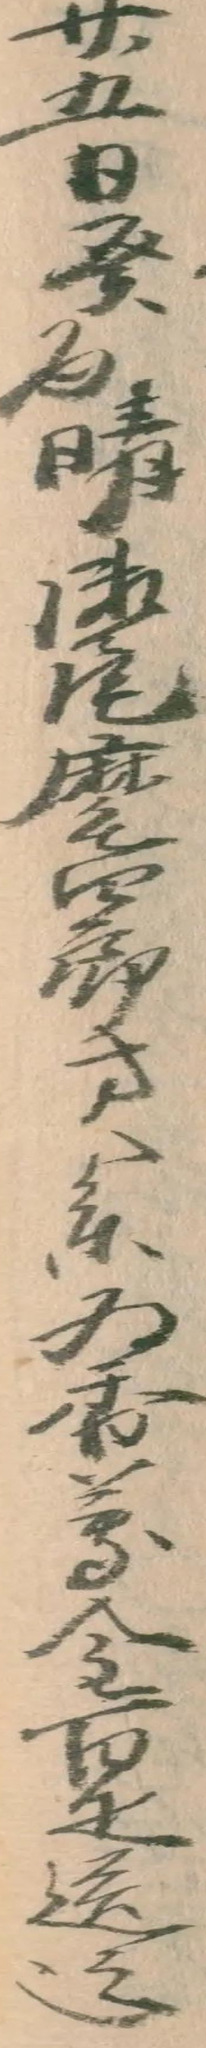廿五日癸酉晴瀬尾磨四郎方へ参為香奠金百疋送之也
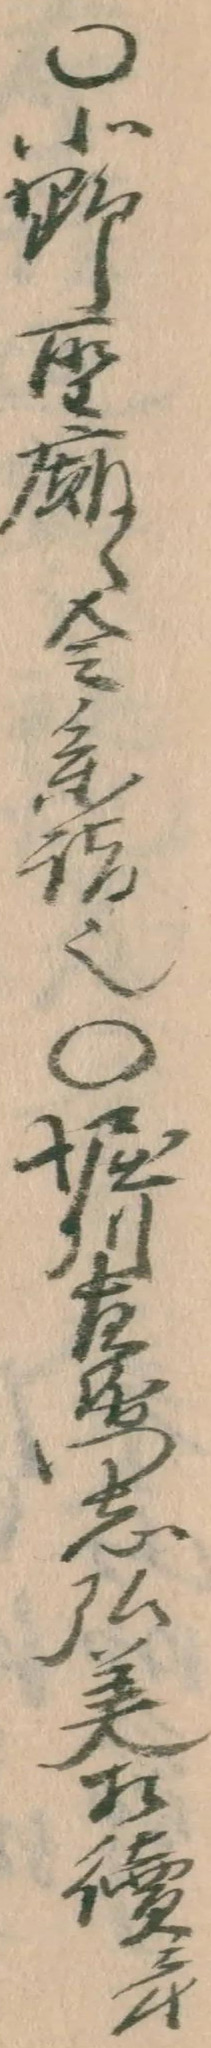○小野聖廟へ令参詣也○堀川左衛門志弘美相續ニ付
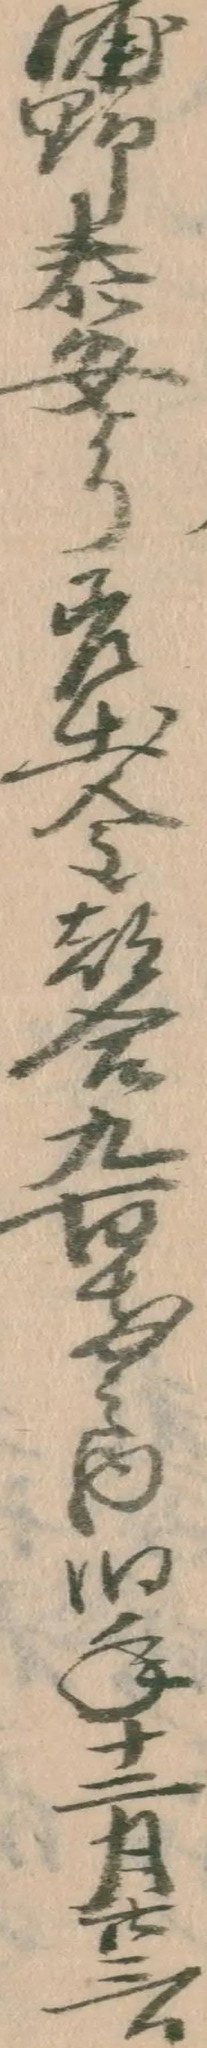浦野泰安より差出金都合九百両之内旧年十二月廿三日
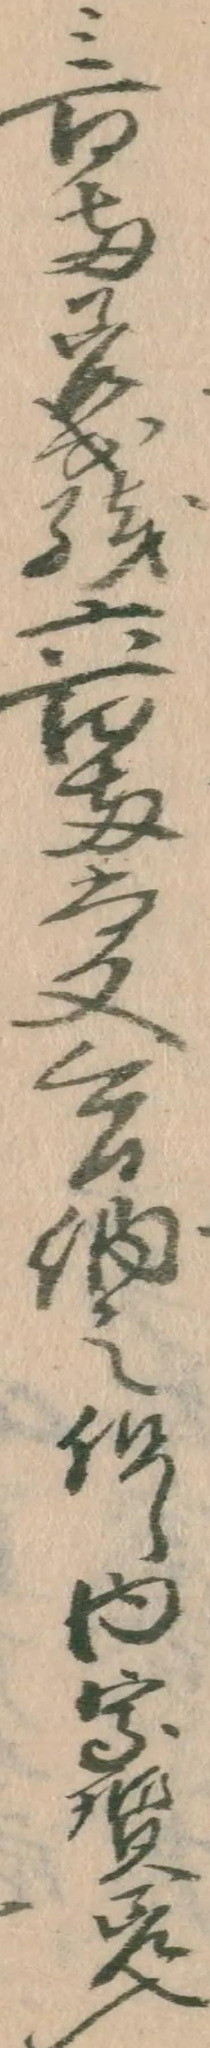三百両差出残六百両尚又今日納之但し内家質差入
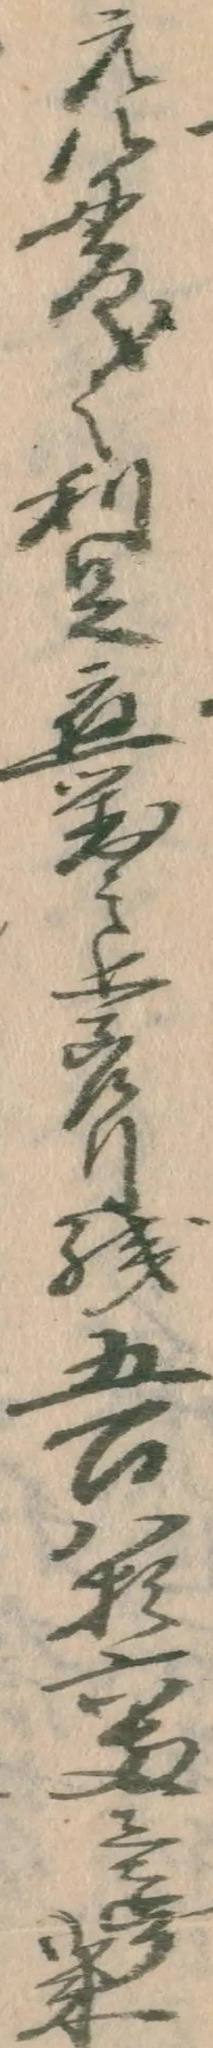元八貫匁之利足應對之上差引銭五百八拾六両壱歩弐朱
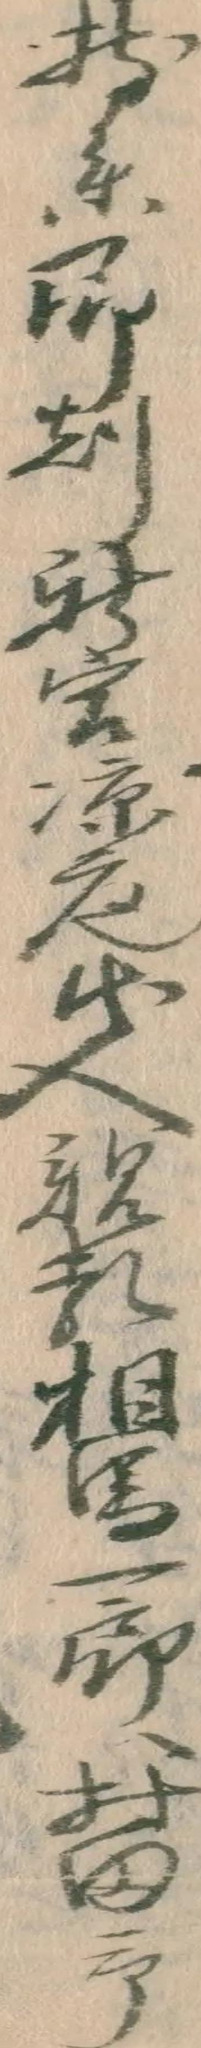持参即刻新宮涼庭代人親類相馬一郎へ村田予
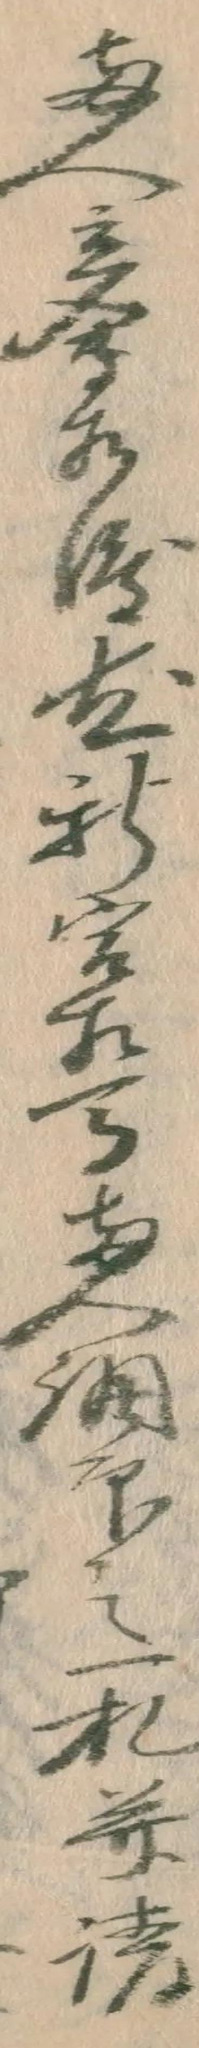両人立會相渡尤新宮相馬両人調印之一札幷請
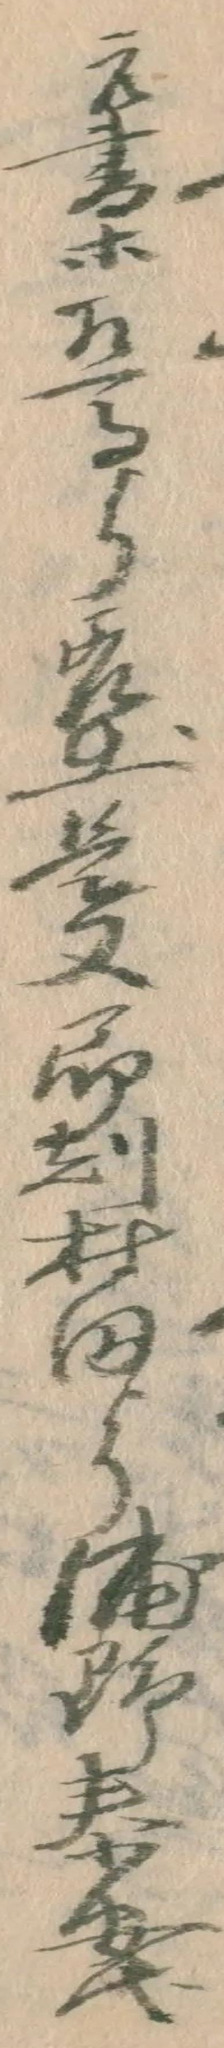取書等相馬より差出是又節刻村田より浦野泰安代
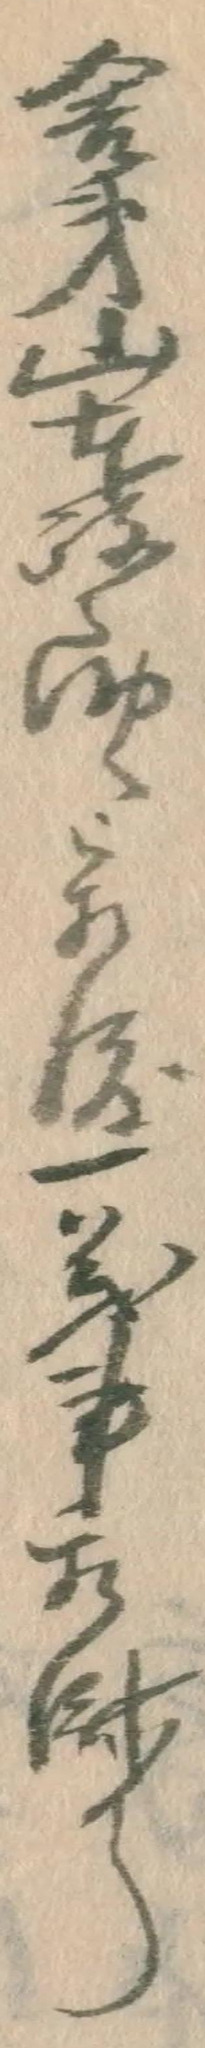舎弟山本政之助へ被相渡一義事相済了
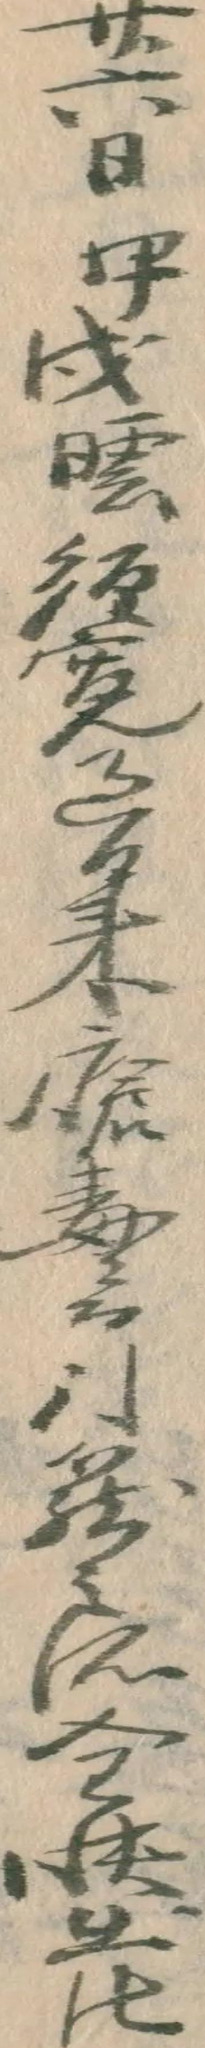廿六日甲戌曇経寛過日来瘡毒ニ而引籠之所全快出仕
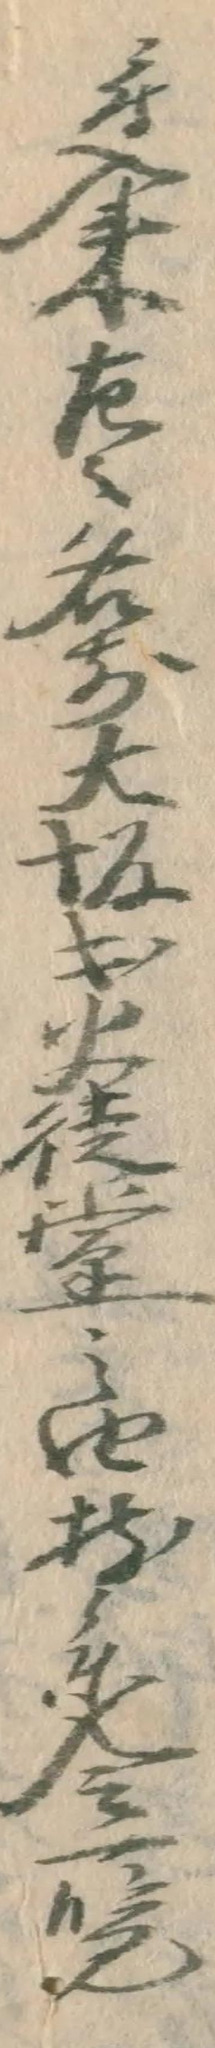ニ付入来左之名前大坂出火徒堂之由持参令一覧
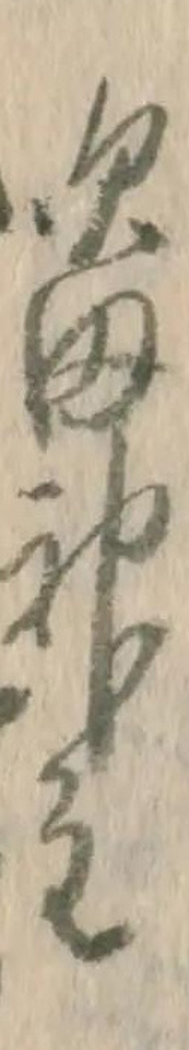吹田神主
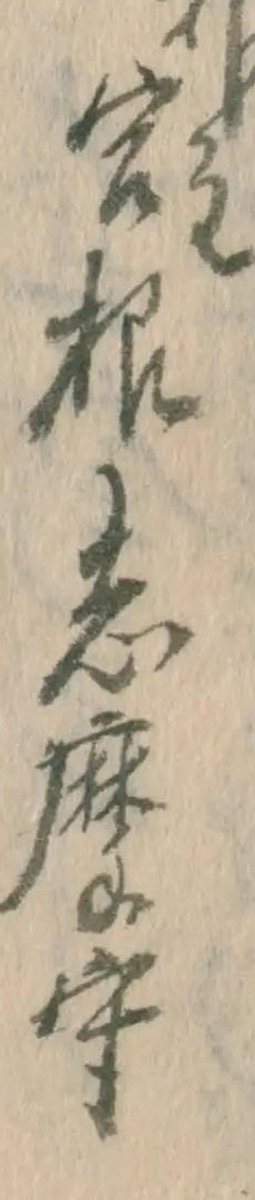宮根志摩守
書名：賀茂社記録. 第67冊
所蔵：国立国会図書館 National Diet Library, JAPAN
